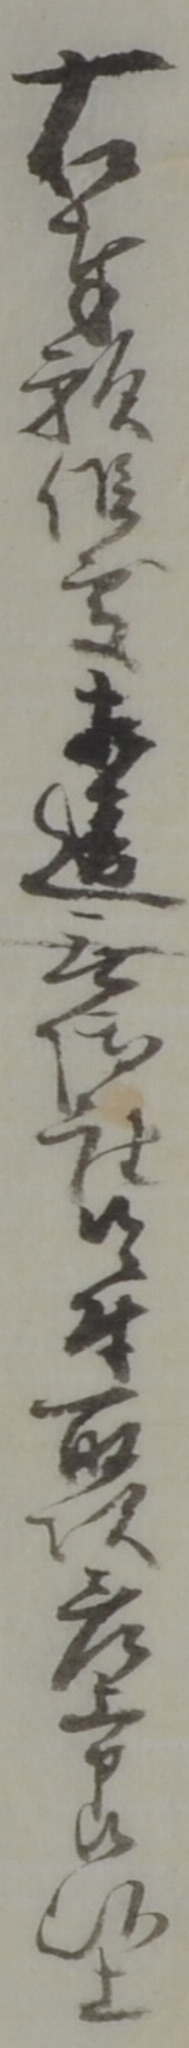右奉願候處相違無御座候ニ付取次差上申候以上
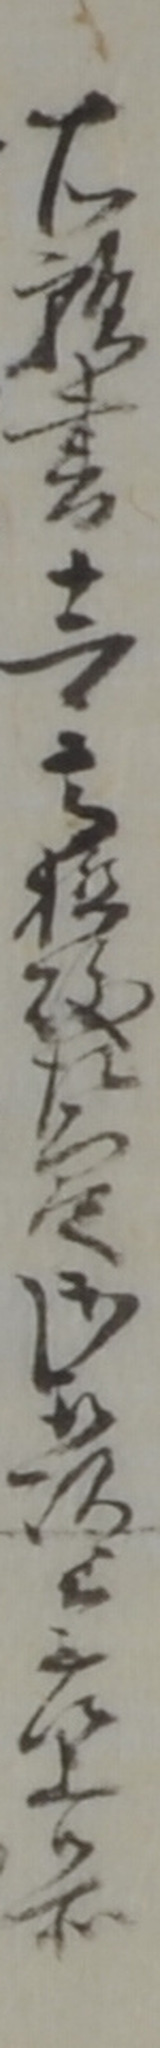右願書十一月二日高橋磯左衛門殿御取次ニ而差上候所
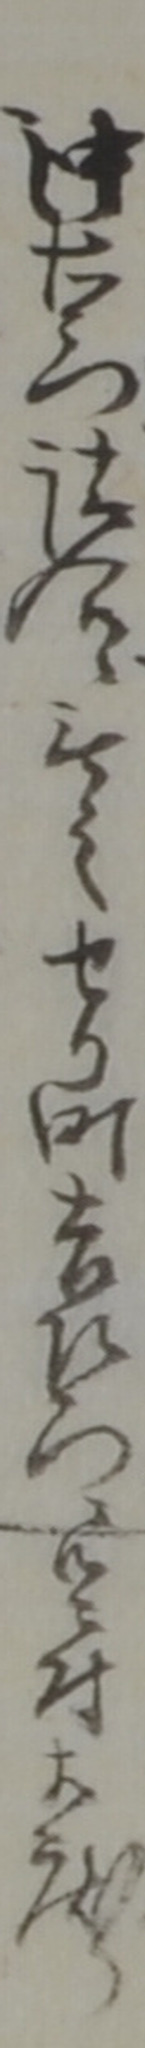沖右衛門請合ニ無之せり町吉左衛門二候ニ付相戻り
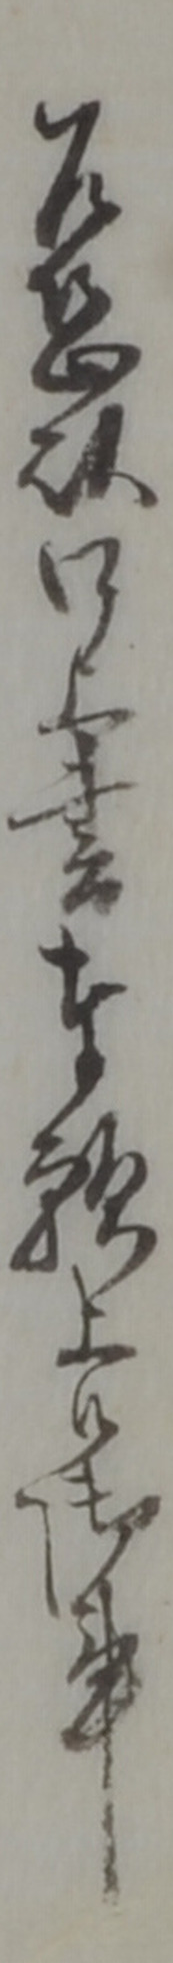乍恐以口上書奉願上候御事
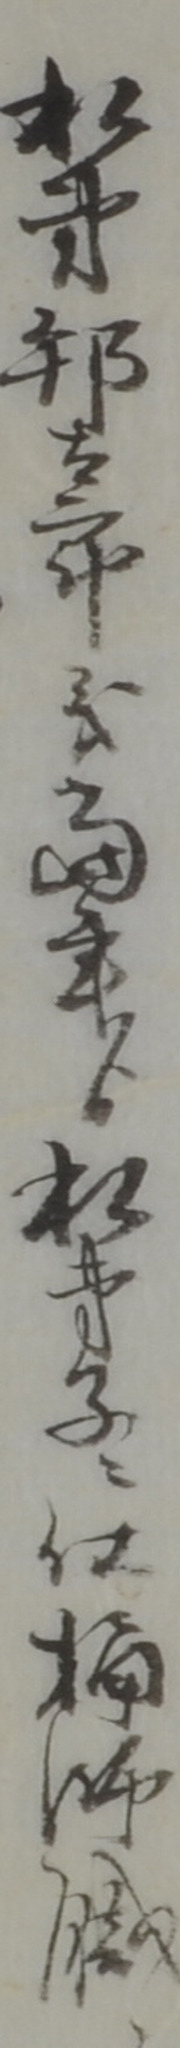私弟邦太郎義当年ゟ私弟子ニ仕桶師職ニ
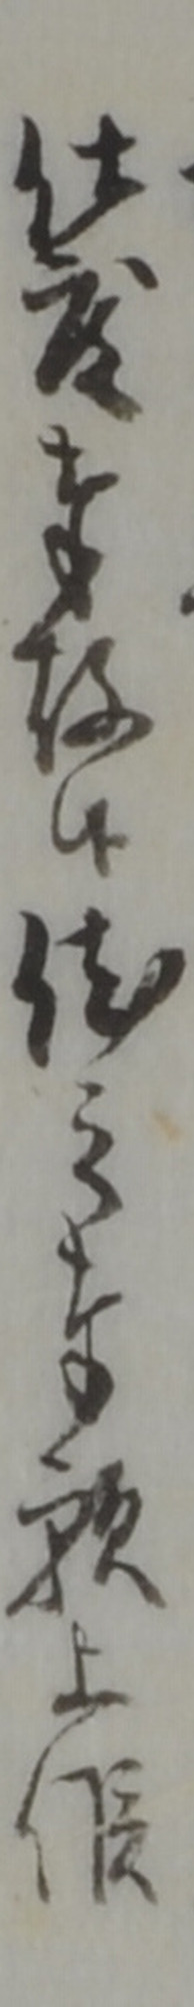仕度奉存候依之奉願上候
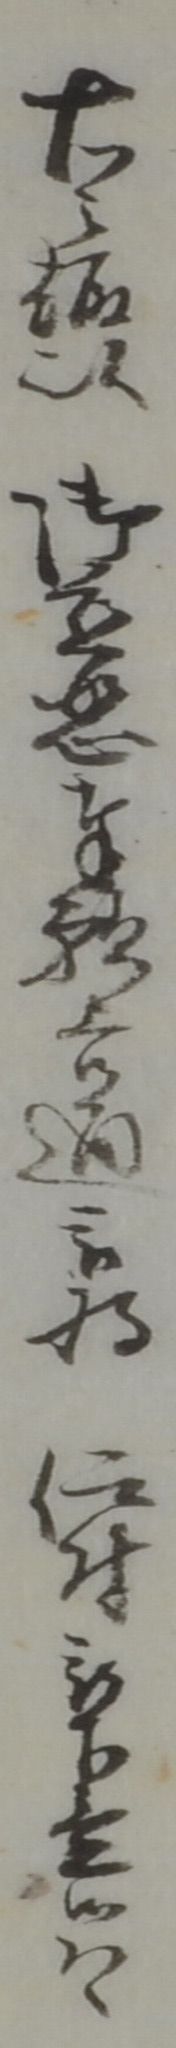右之趣以御慈悲奉願上候通被為仰付被下置候ハヽ
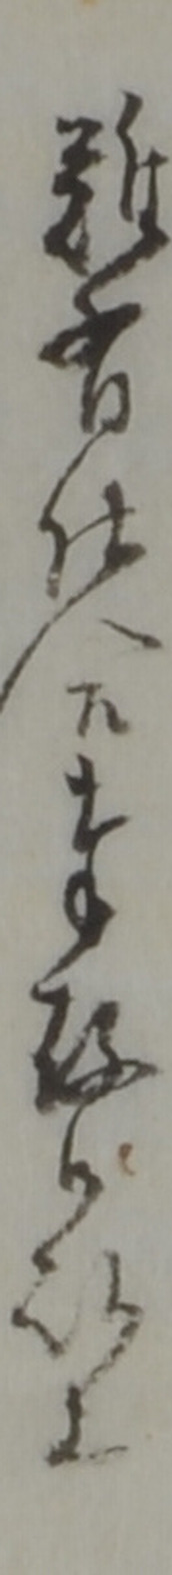難有仕合奉存候以上
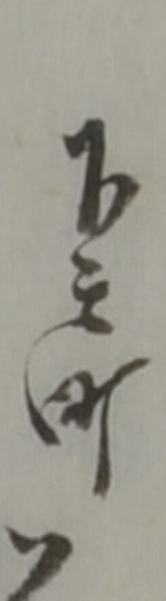下モ町
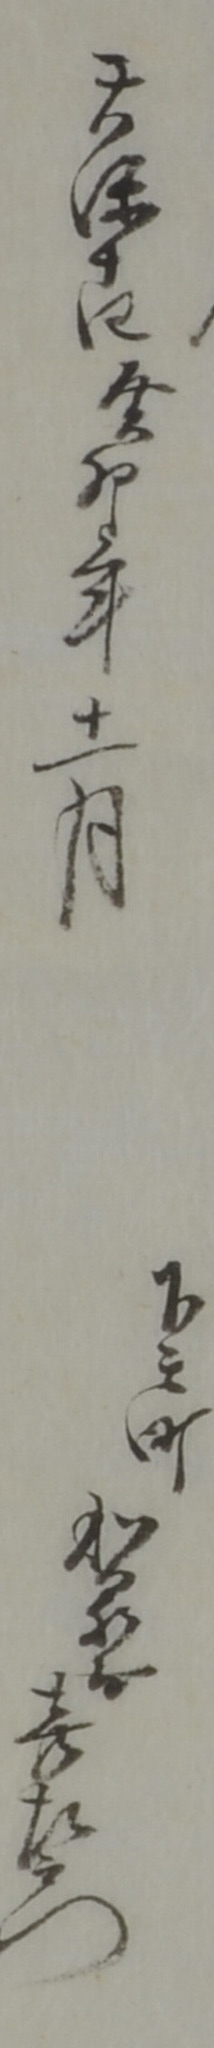天保十四年癸卯年十一月嶋田屋
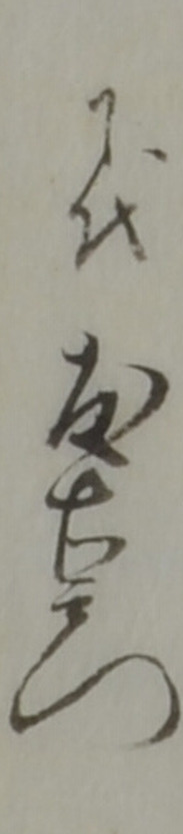丁代友右衛門
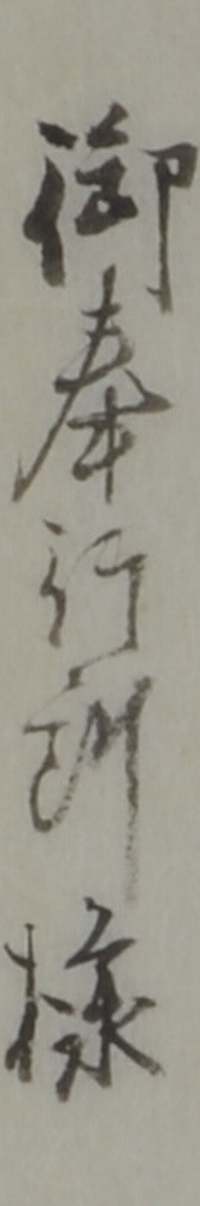御奉行所様
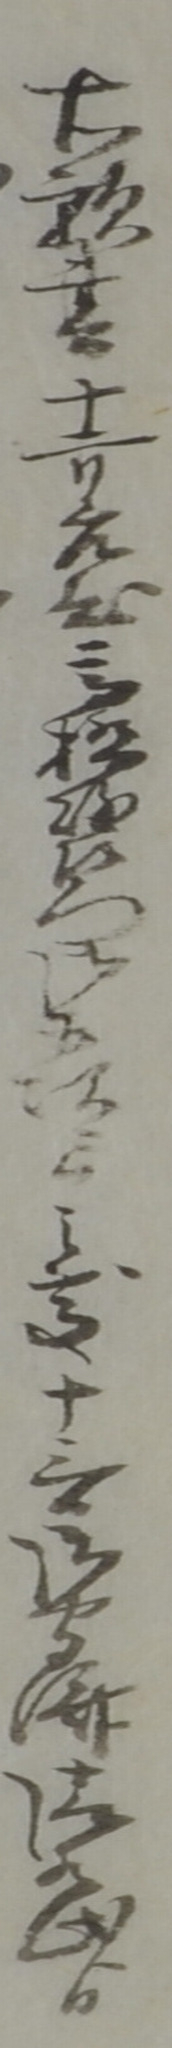右願書十二日差出高橋礒左衛門御取次二而之處十三日御聞済清水氏ゟ
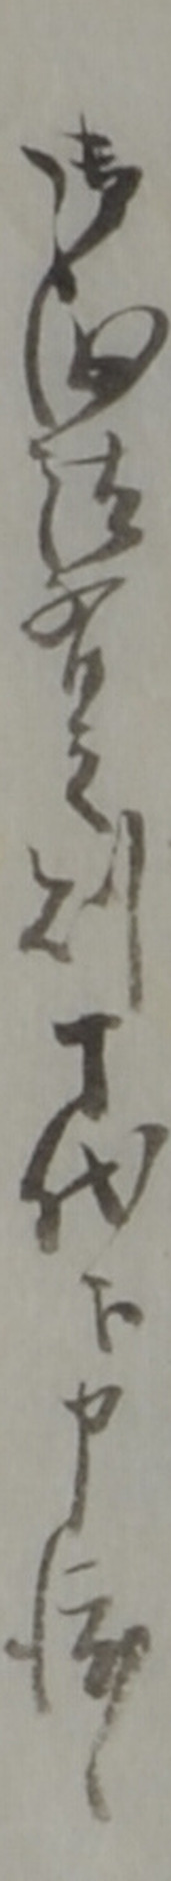御沙汰有之則丁代え申渡候
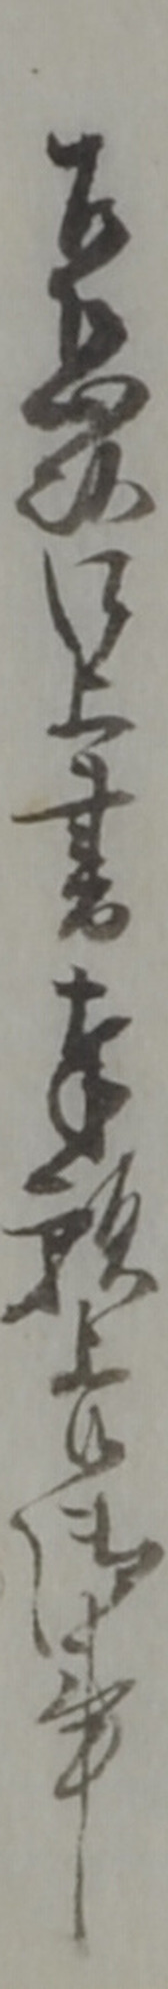乍恐以口上書奉願上候御事
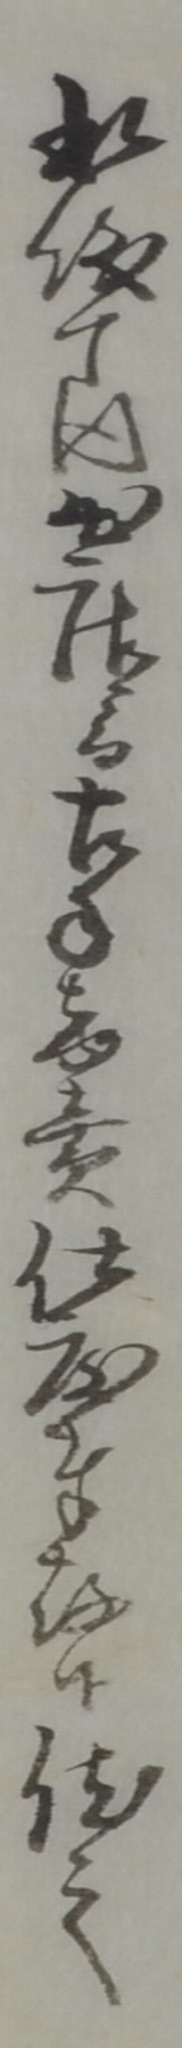私儀丁内出店二而古手商売仕度奉存候依之
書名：諸願書控簿
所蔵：伊那市立高遠町図書館・合同会社AMANE
